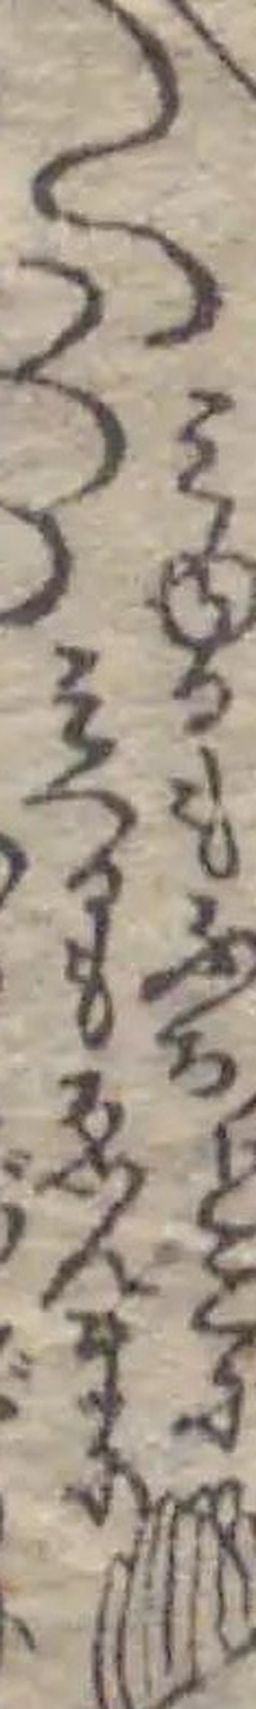みへるもゑんまに
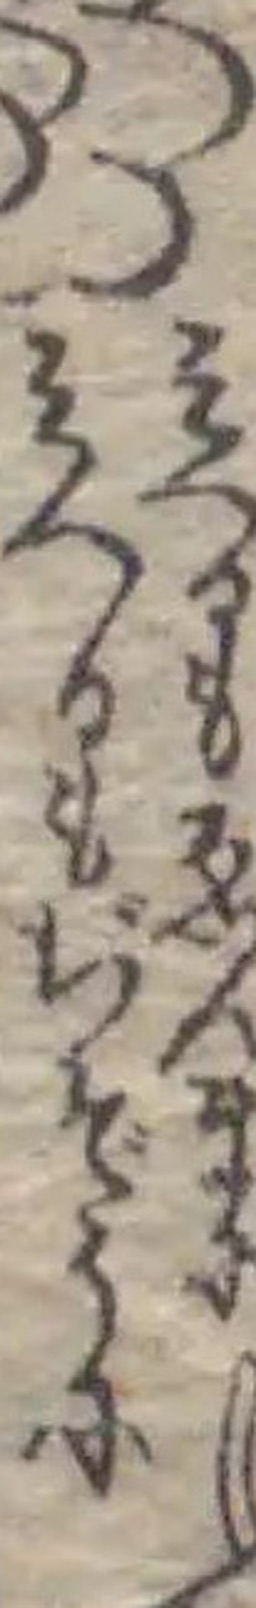みへるもぢぞうに
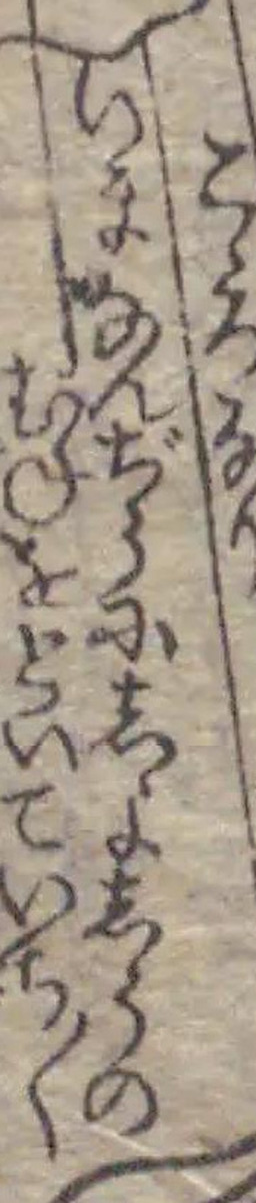いまなんぢらにしよしうの
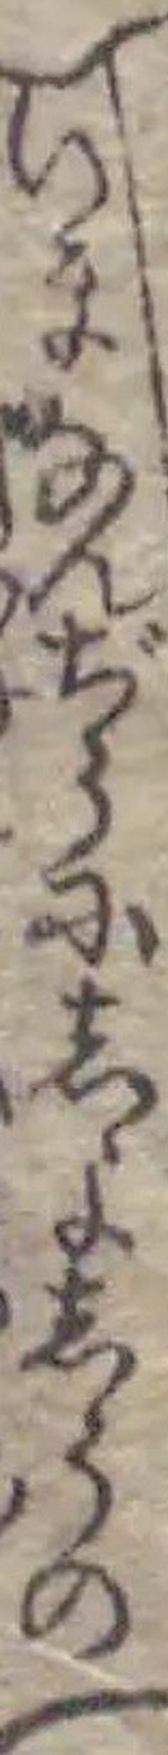いまなんぢらにしよしうの

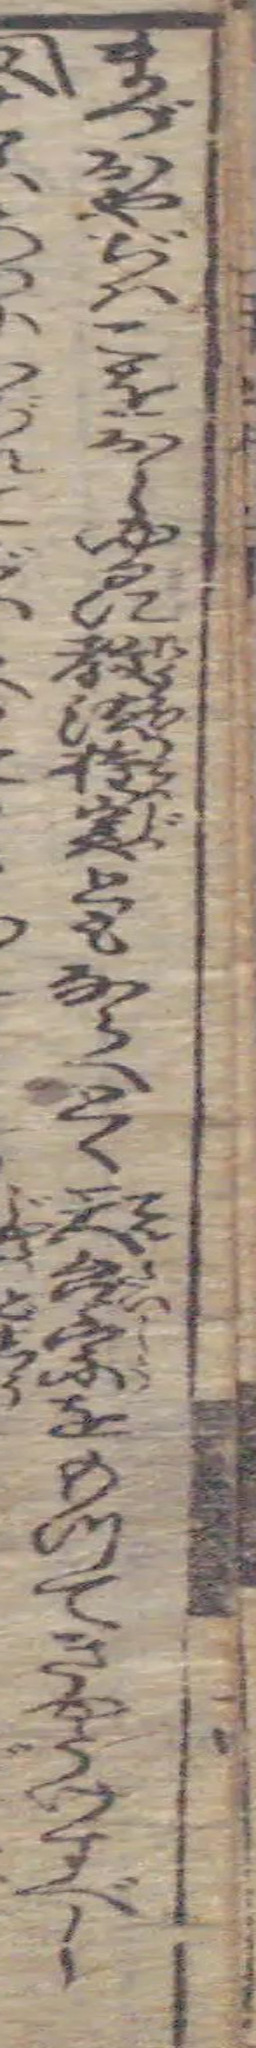まづおやぢはこをおしゆるに教法権実ともならへとく天台宗をもつてきやうけすべし
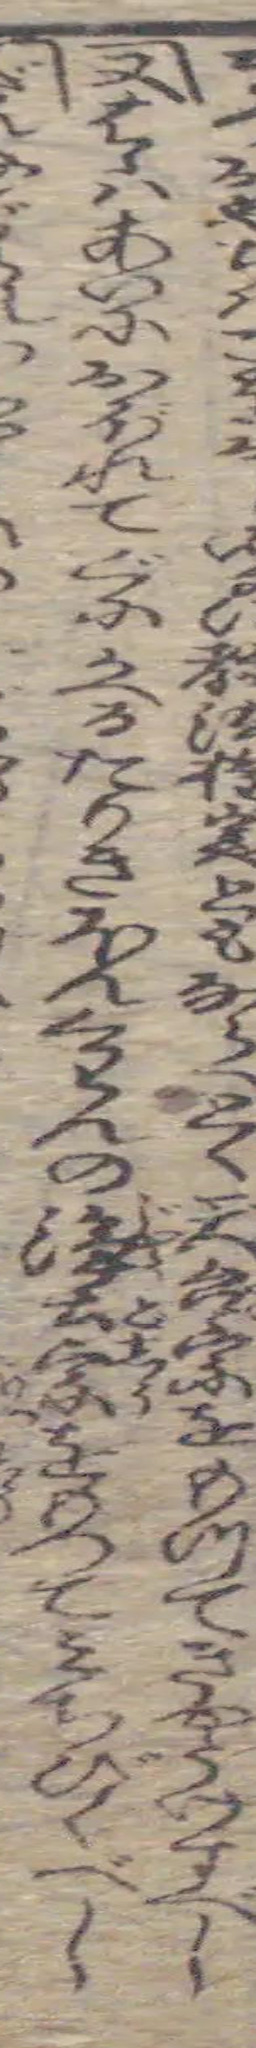〽また母はあいにおぼれてぐにかへるたりきほんくわんの浄土宗をもつてみちびくべし
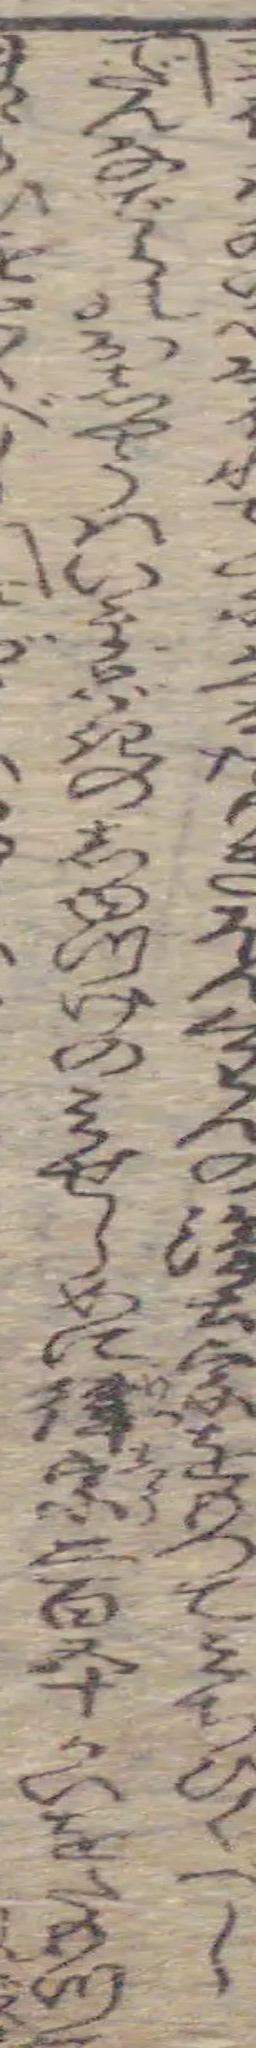〽だんなでらのおしやうはいまどきのしゆつけのみせしめに律宗二百五十かいをたもつて
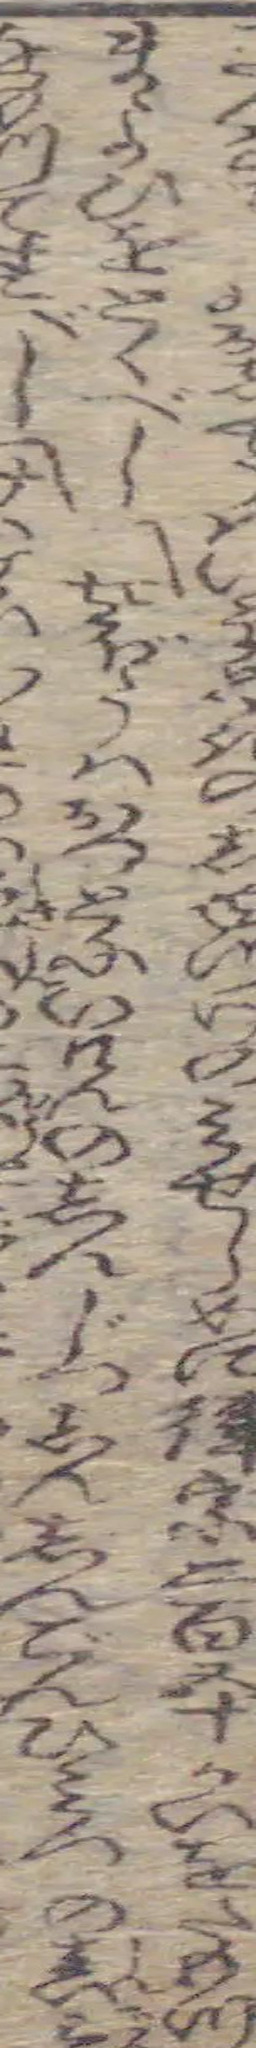まよひをとくべし〽女ぼうはおつとにいけんのしんじつしんしんごんひみつの真言宗
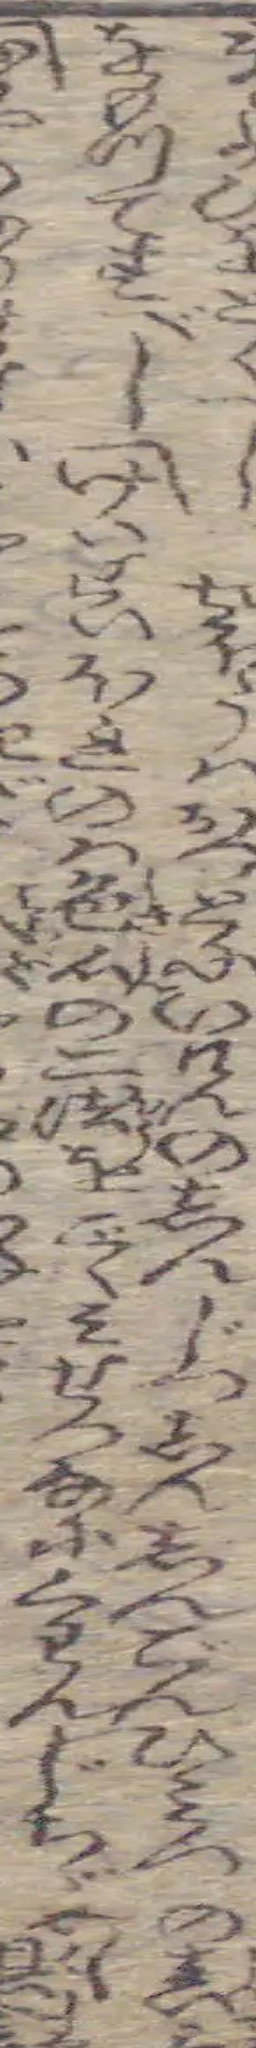をもつてすべし〽けいせいほれのは色心の二法を正くみせつなにくわんじちゞめし倶舎宗
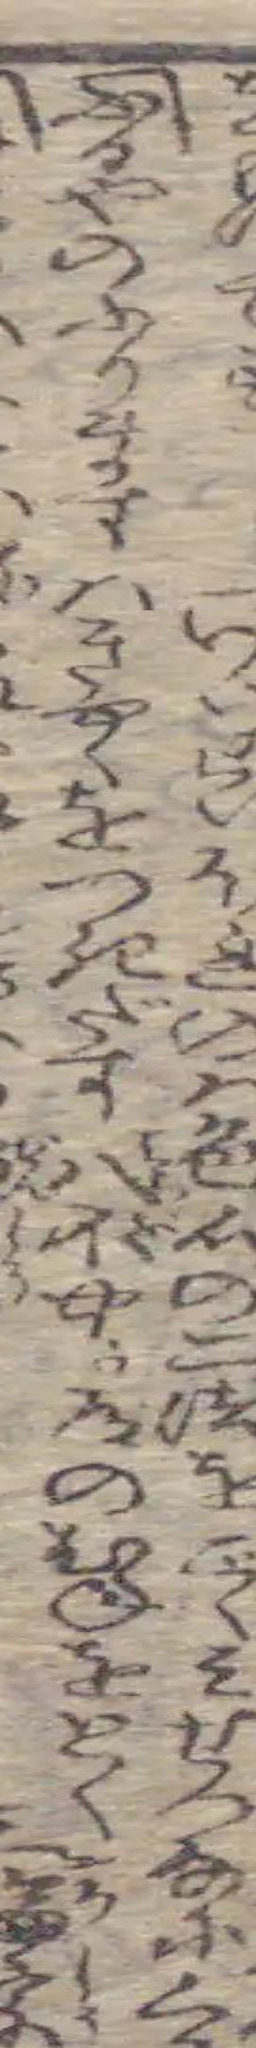〽ふるやのふりますはきやくをつきだす八不中道のむねをとく三論宗
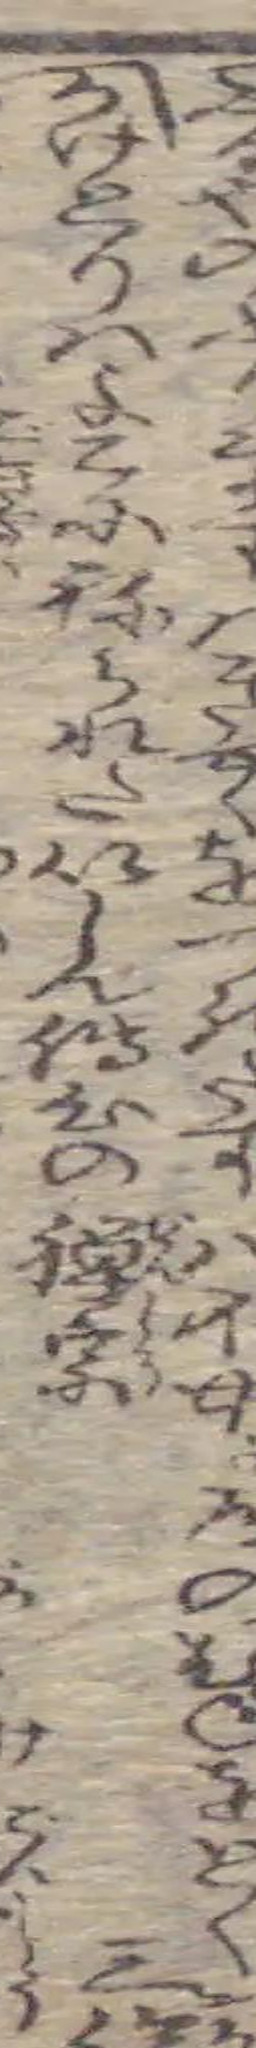〽かけとりはよこにねられたいしん伝心の禅宗
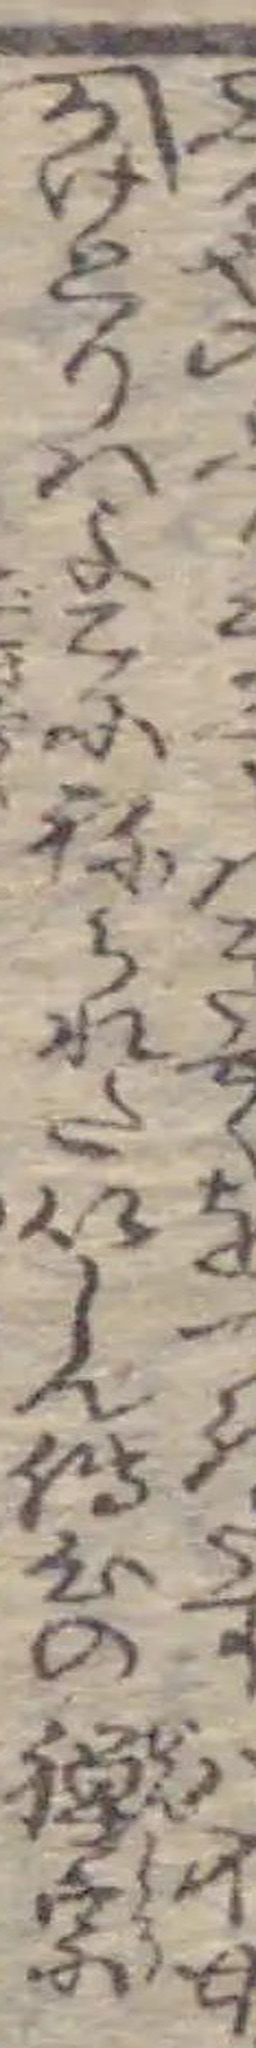〽かけとりはよこにねられたいしん伝心の禅宗
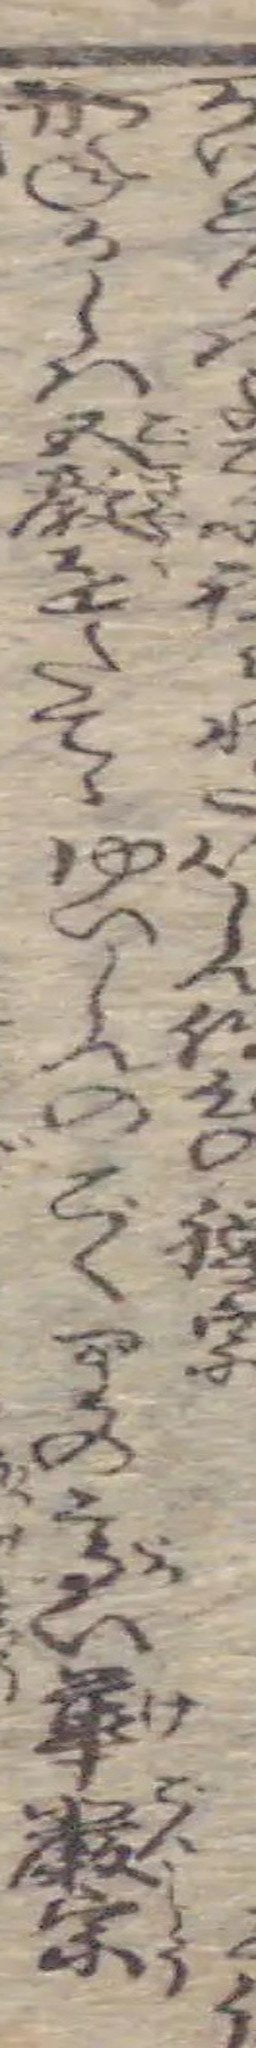〽かねかしは五教をたてゝゆいしんのごくりの法花宗
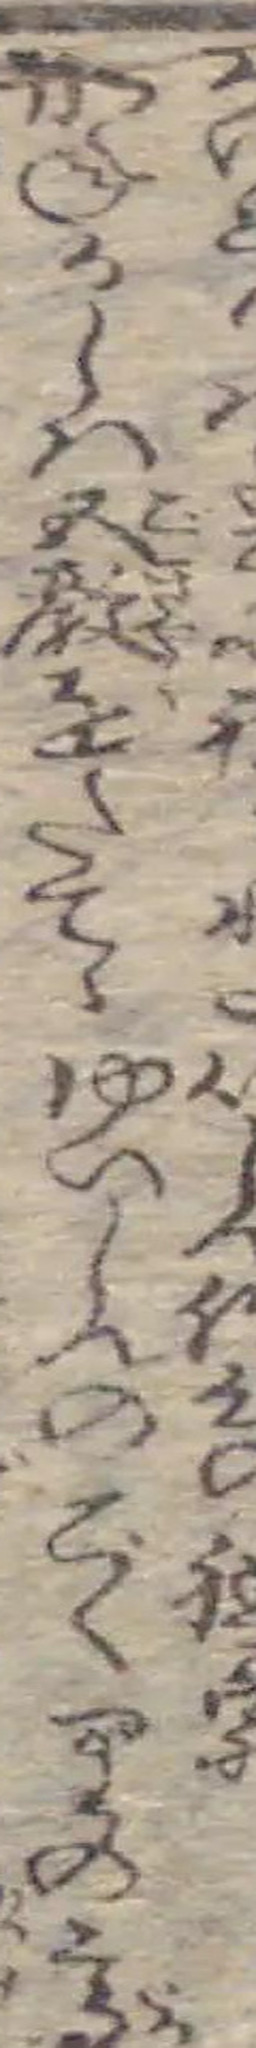〽かねかしは五教をたてゝゆいしんのごくりの法花宗
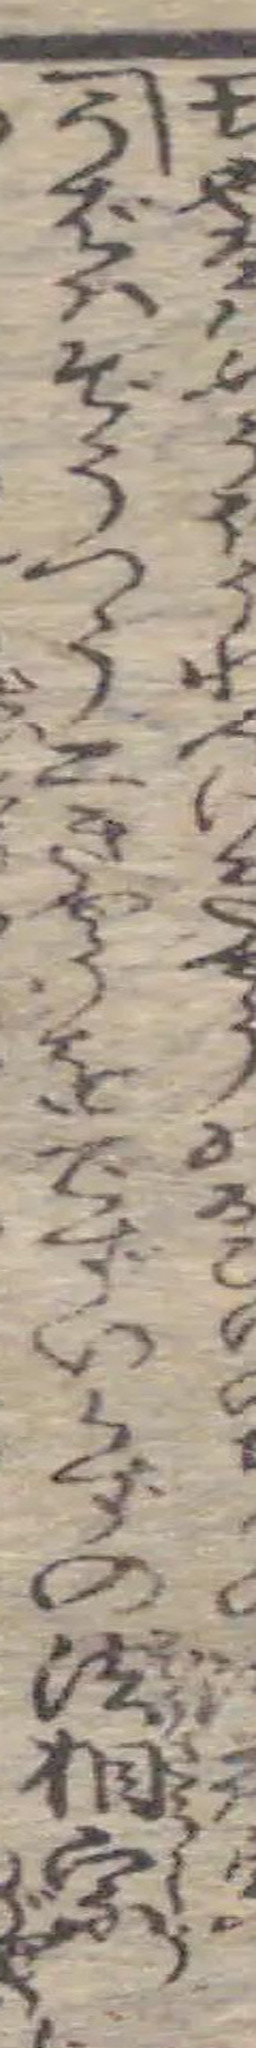〽うばはぞうつう二きやうをでずいらずの法相宗
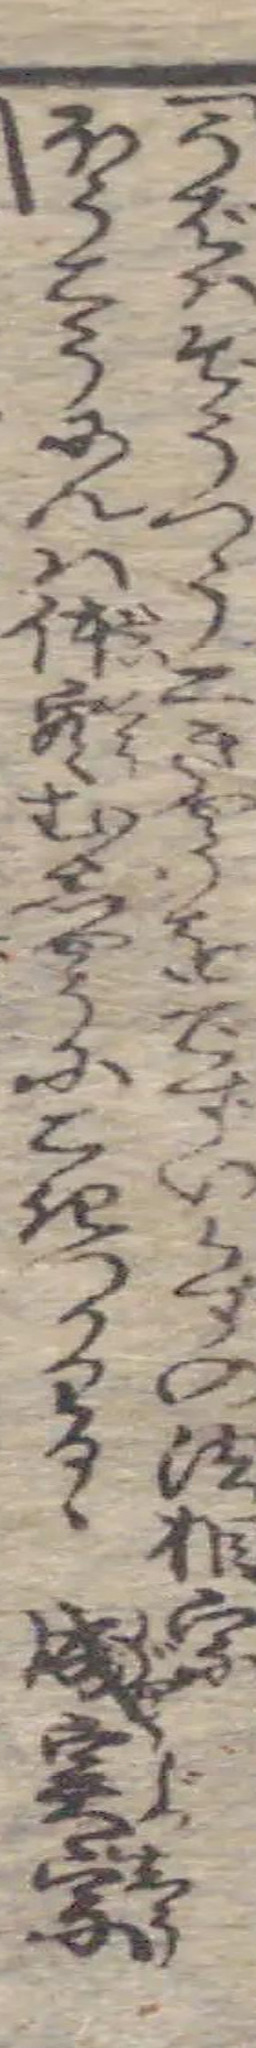ほうこうにんは体空むしやうにこきつかわるゝ成実宗
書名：福壽海旡量品玉 3巻
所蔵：国立国会図書館 National Diet Library, JAPAN
